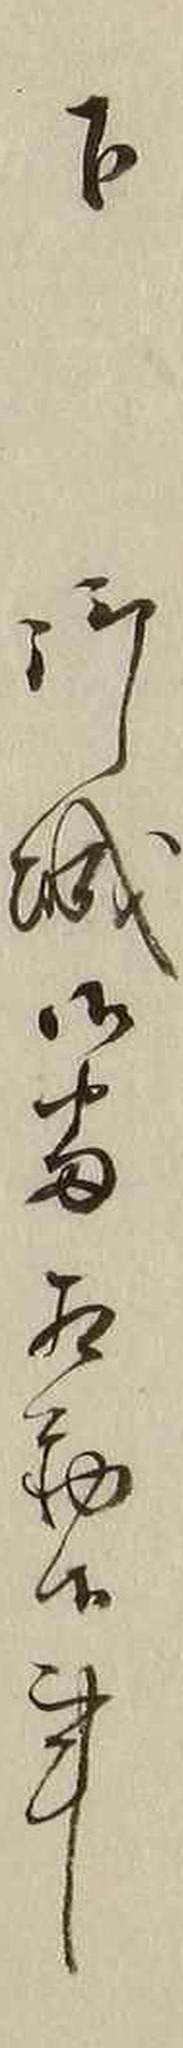下御城御番相勤候事
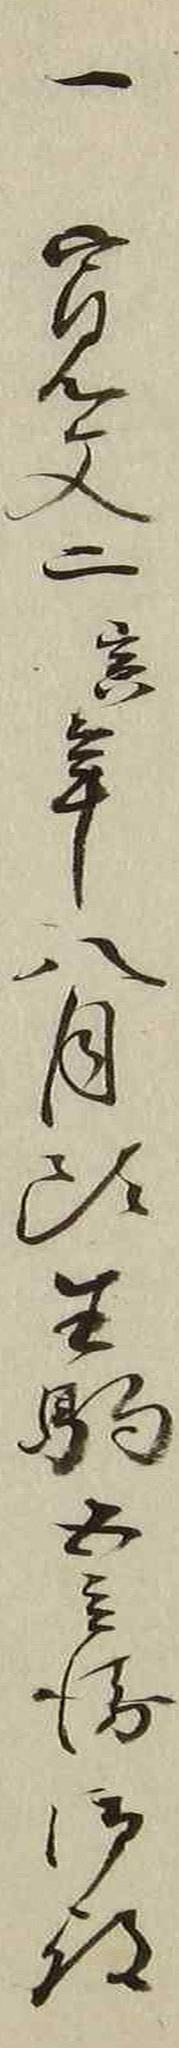一寛文二寅年八月頭生駒五兵衛御役
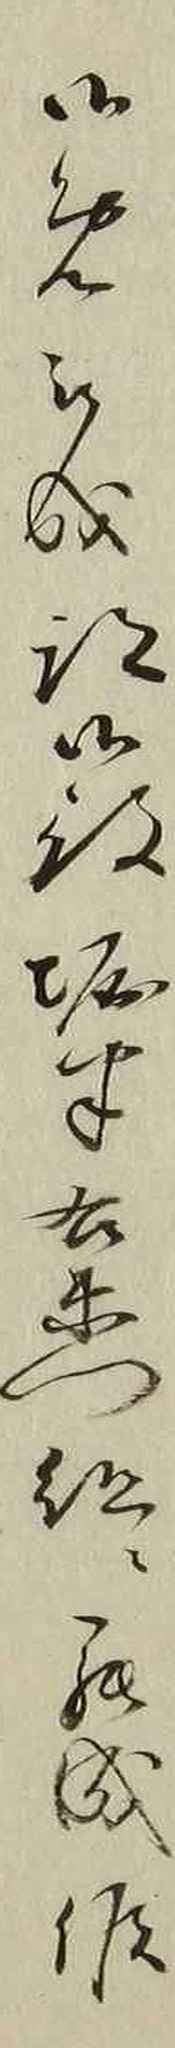御免被成跡御役堀半右衛門組に罷成候
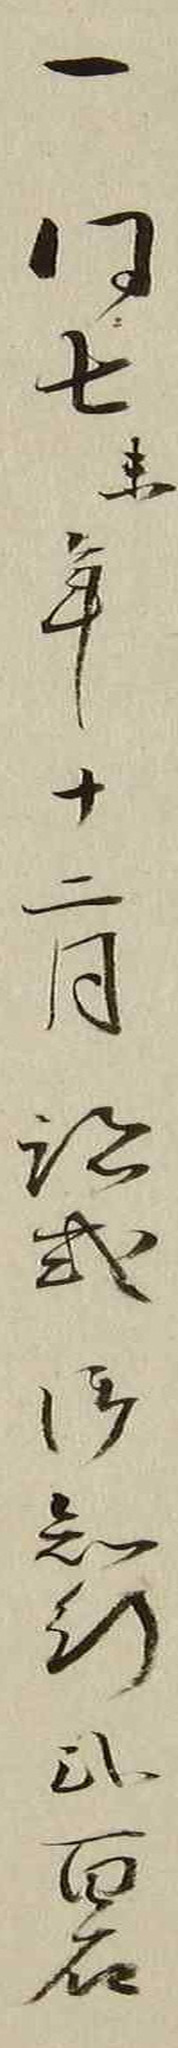一同七未年十二月跡式御知行二百石
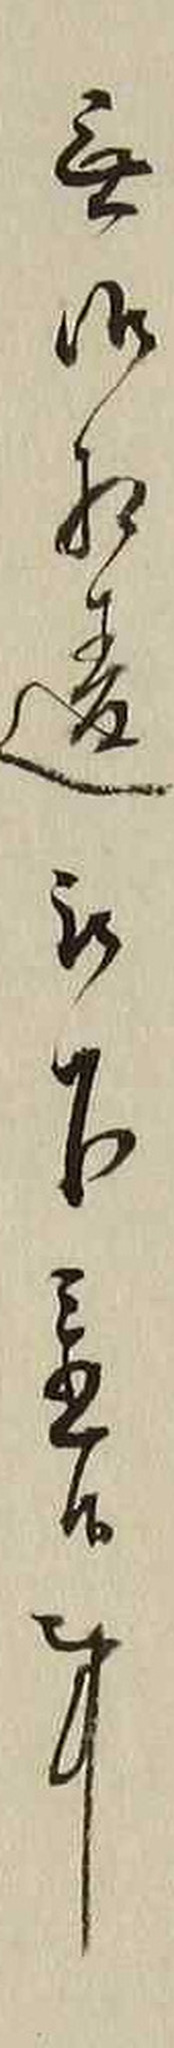無御相違被下置候事
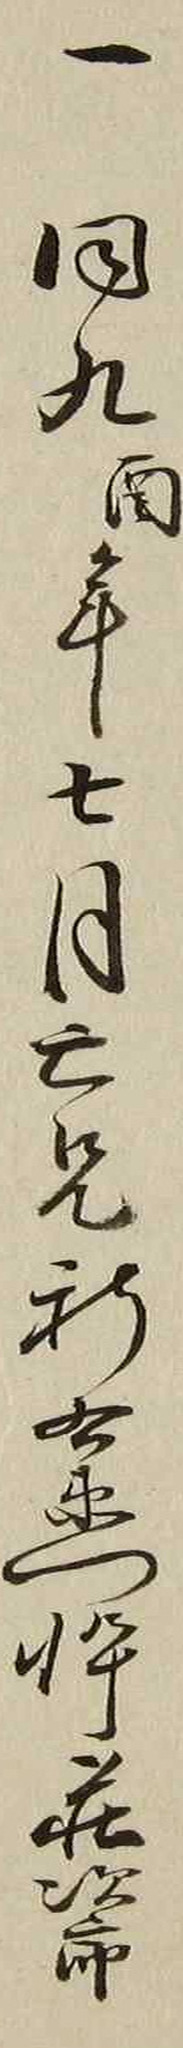一同九酉年七月亡兄新右衛門伜荘次郎
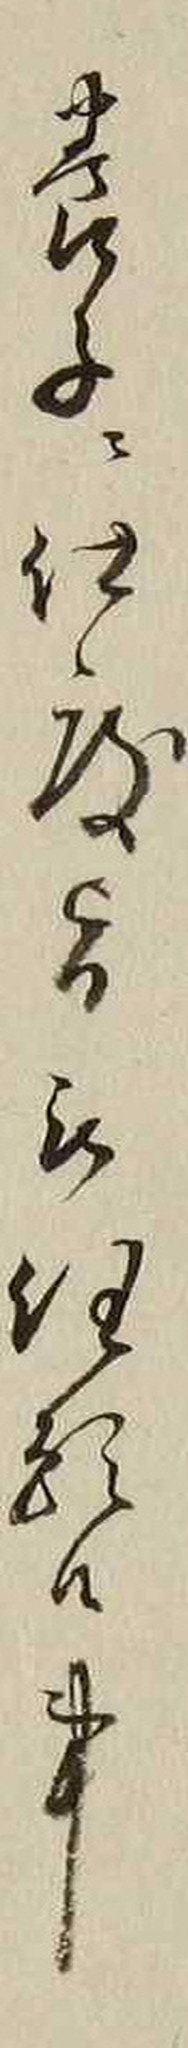養子に仕度旨被任願候事
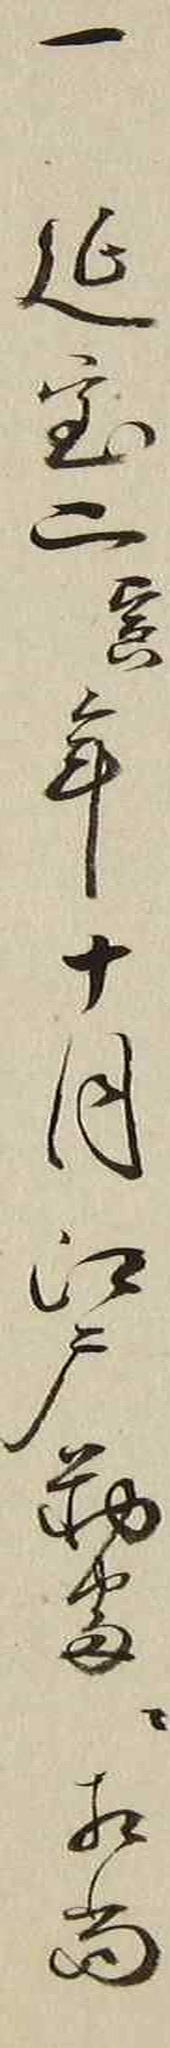一延宝二寅年十月江戸勤番に相当
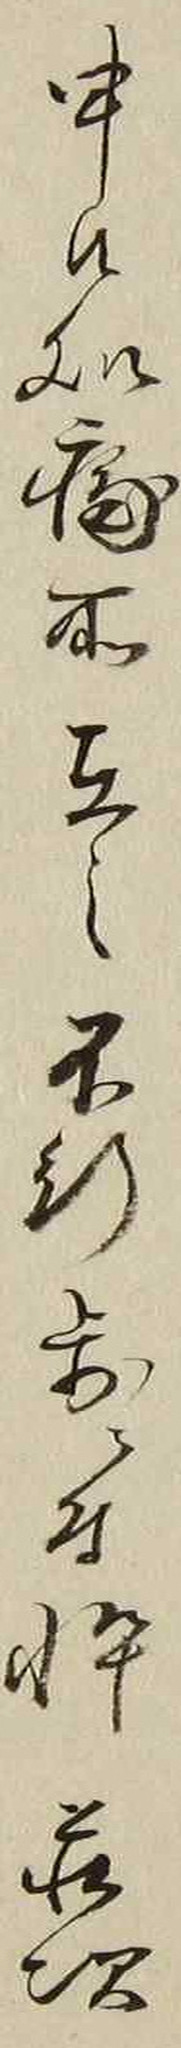申候処病所在之不行歩に付伜荘次
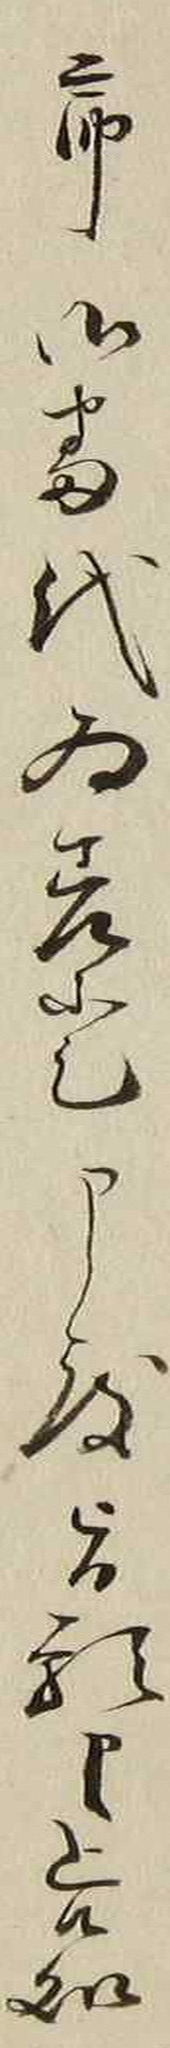郎御番代為差登申度旨願申上候処
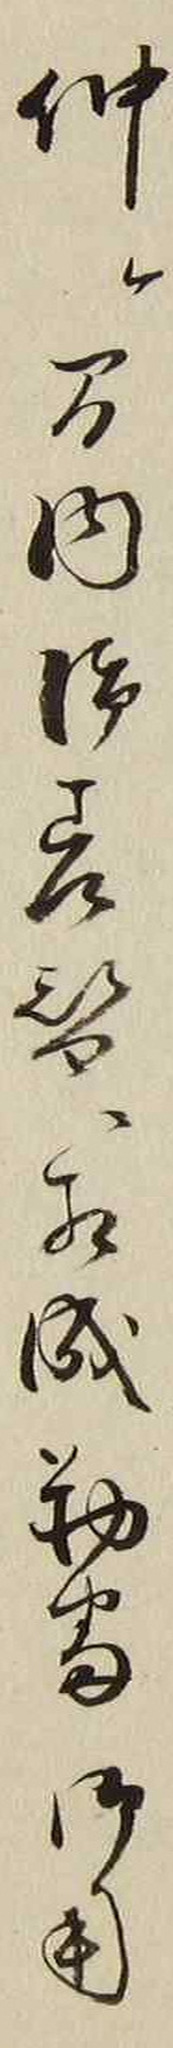仲ケ間内御差替に相成勤番御用
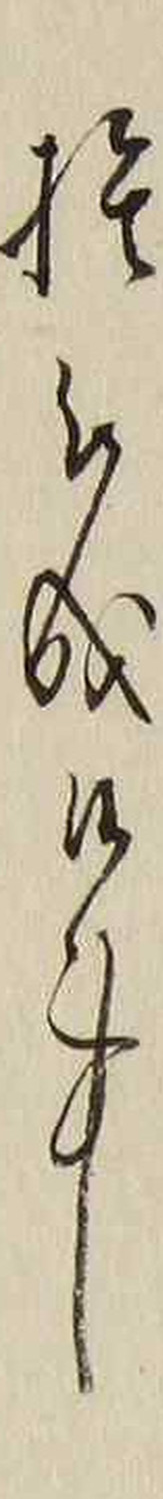捨相成候事
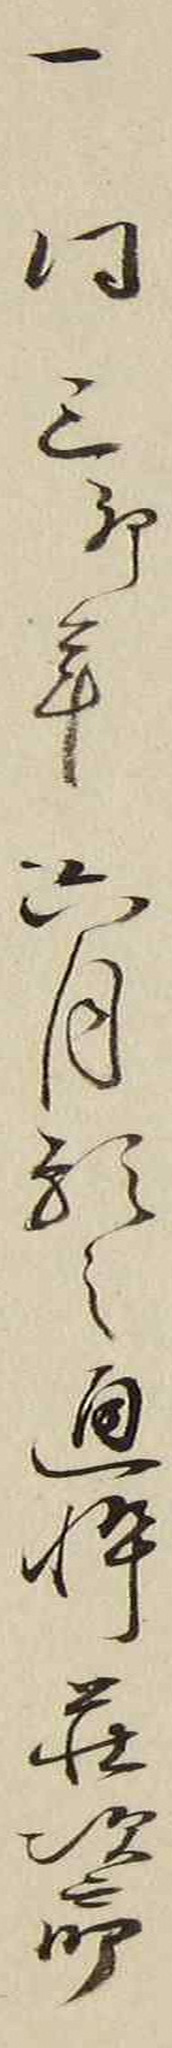一同三卯年六月願之通伜荘次郎
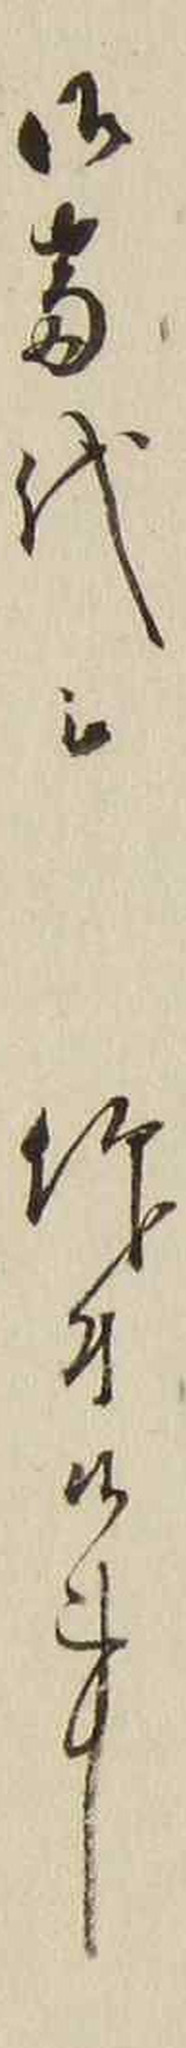御番代被仰付候事
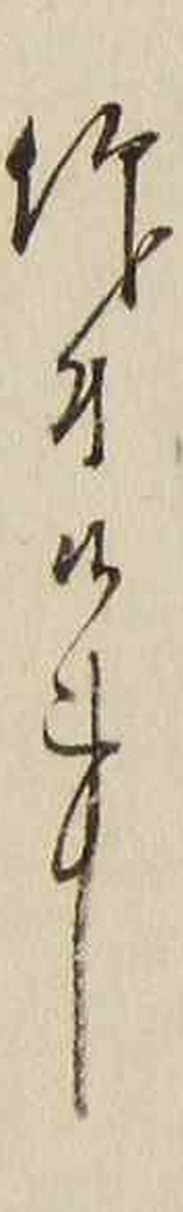仰付候事

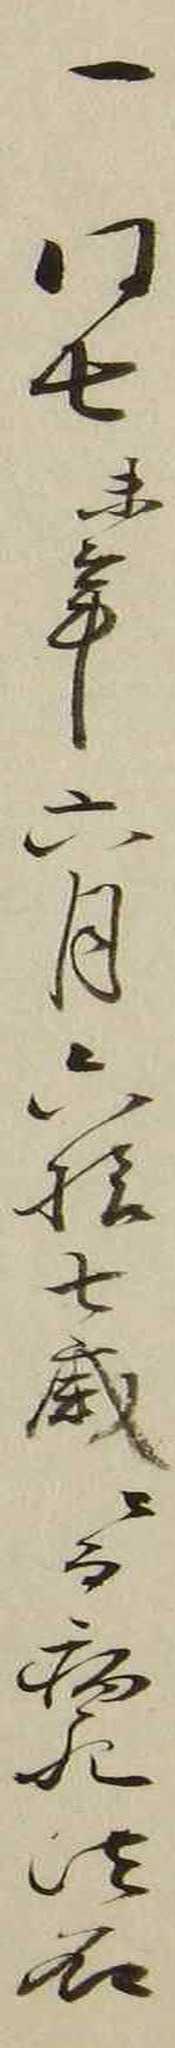一同七未年六月六十七歳にて病死法名
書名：諸士系譜　巻之170　な之部12
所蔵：会津若松市立会津図書館
